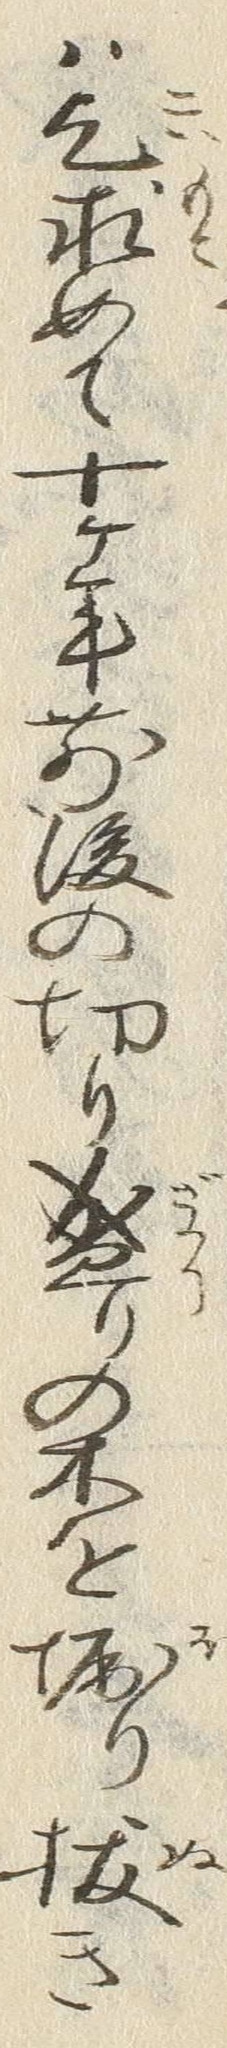は乞求めて十ヶ年前後の切り盛りの木を掘り抜き
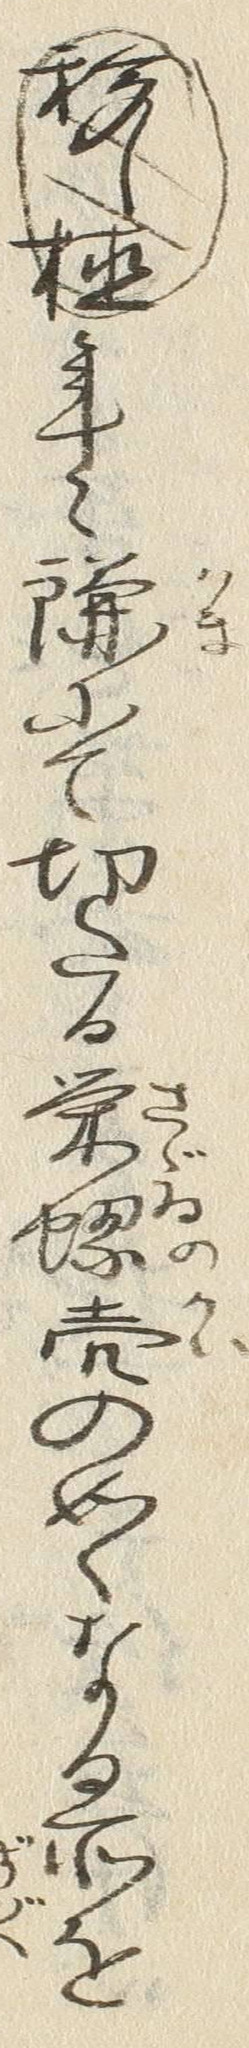移し植年々鎌尓て切たる栄螺買の如くなる所を
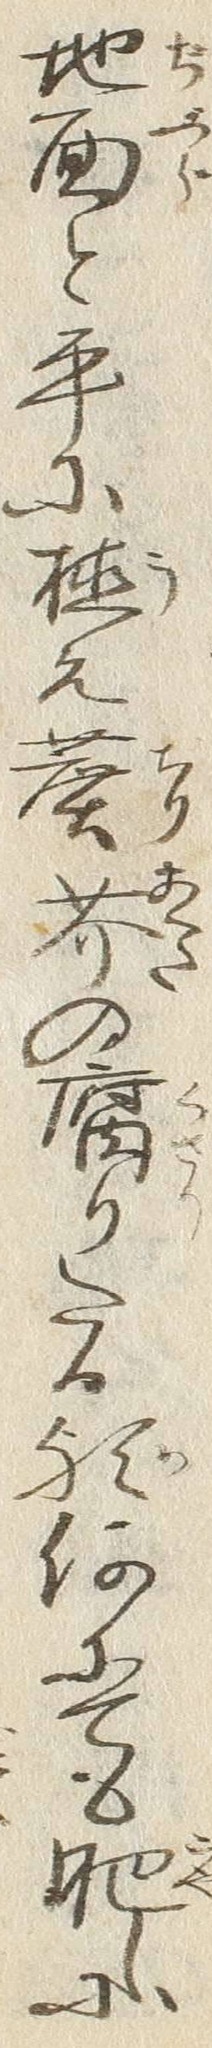地面と平尓植え塵芥の腐りたる歟何尓ても肥し尓
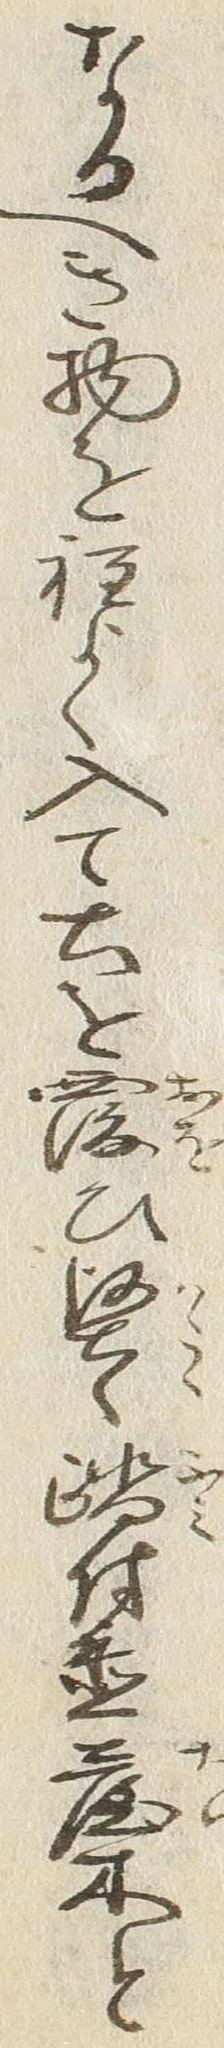なるへき物を程よく入て土を覆ひ堅く踏付置臺木と
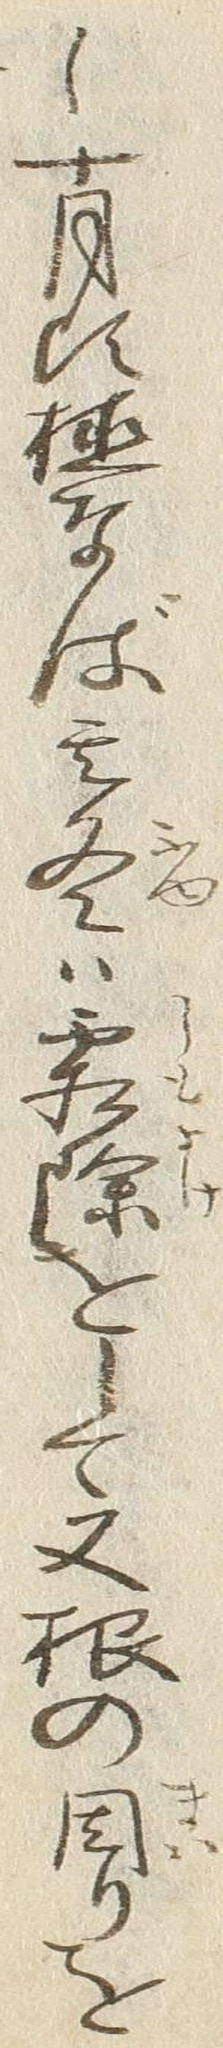し十月頃植なば其冬は霜除をして又根の周りを
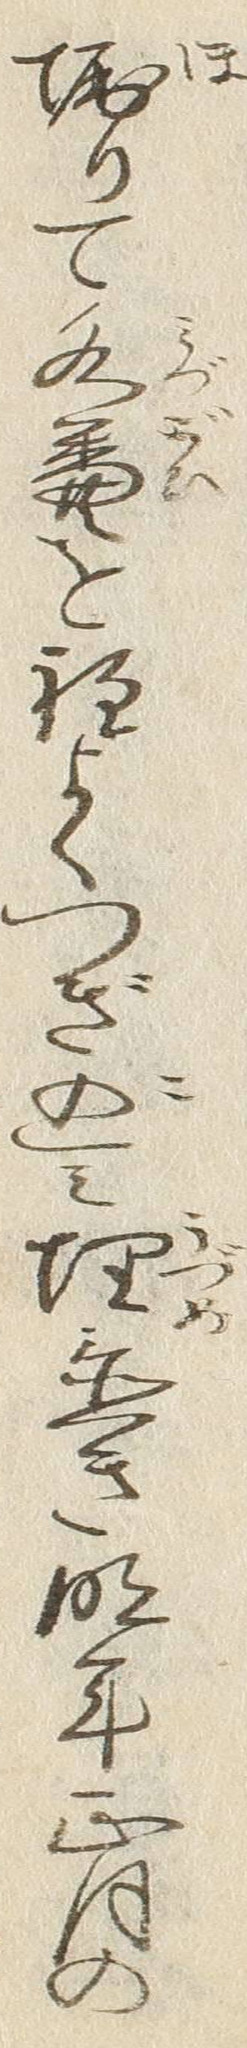堀りて水糞を程よくつぎ込み埋置き明年正月の
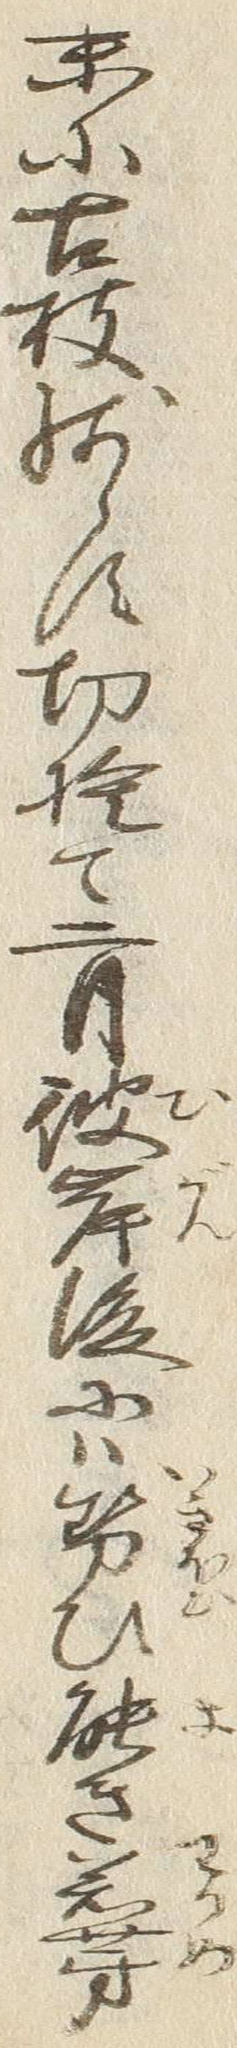末尓古枝残ら須切捨て二月彼岸後尓は勢ひ能き若芽
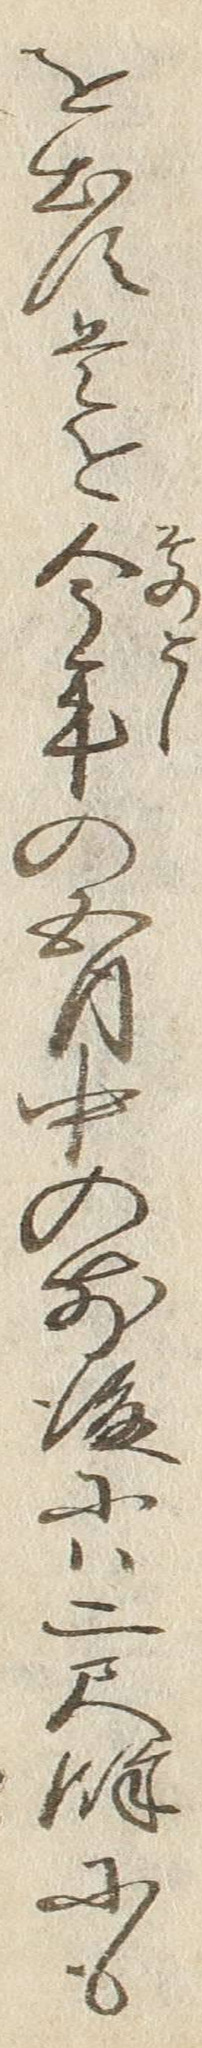を出須是を今年の五月中の前後尓は二尺餘尓も

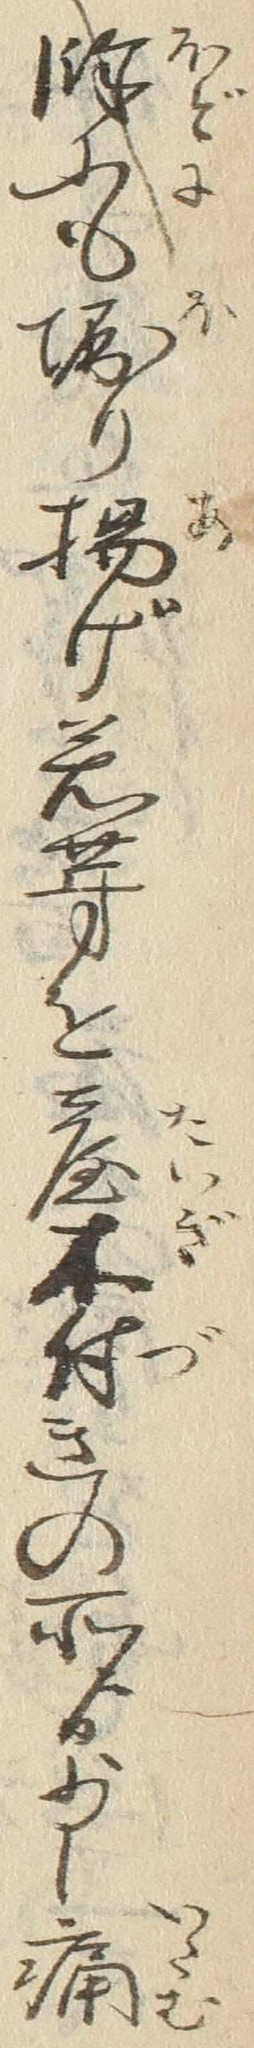餘尓も堀り揚げ若芽を臺木付きの所ゟ少し痛
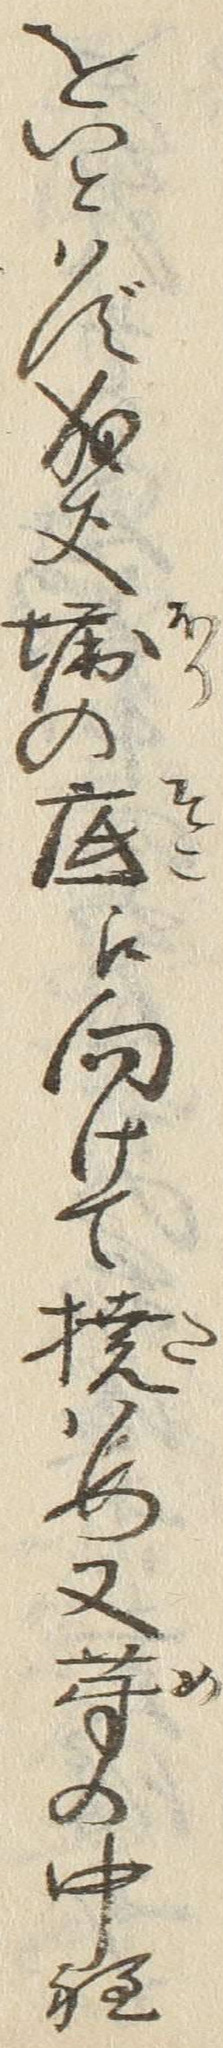をいとはず成丈堀の底江向けて撓はめ又芽の中程
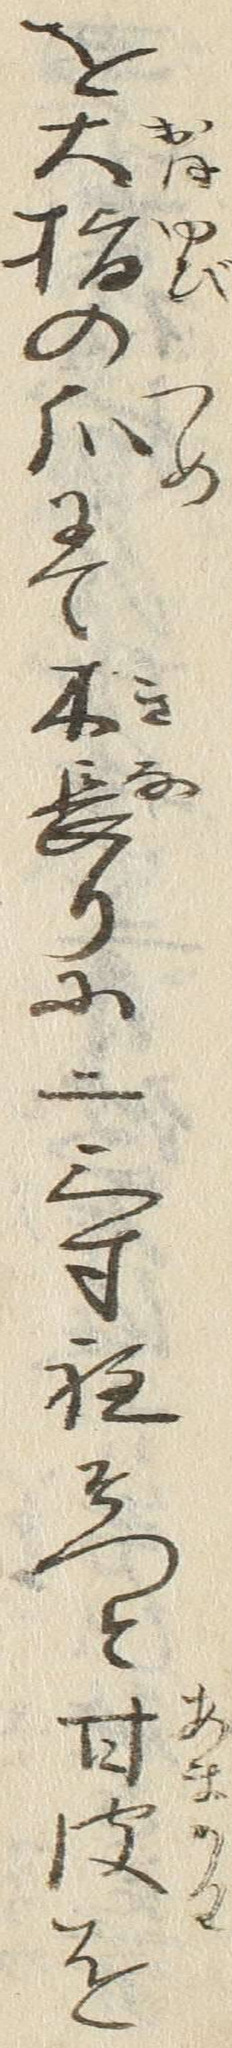を大指の爪尓て木長り尓二三寸程そつと甘皮を
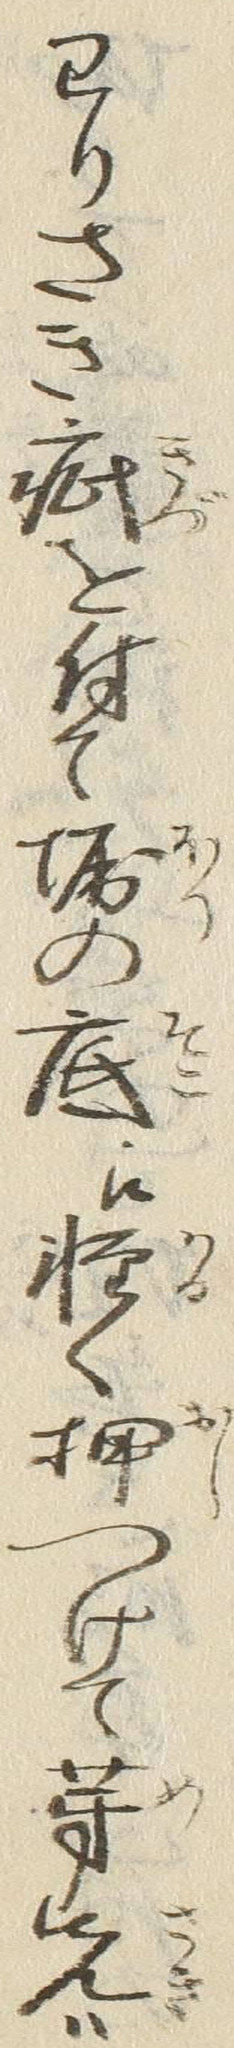わりさき疵を付て堀の底江軽く押つけて芽先は
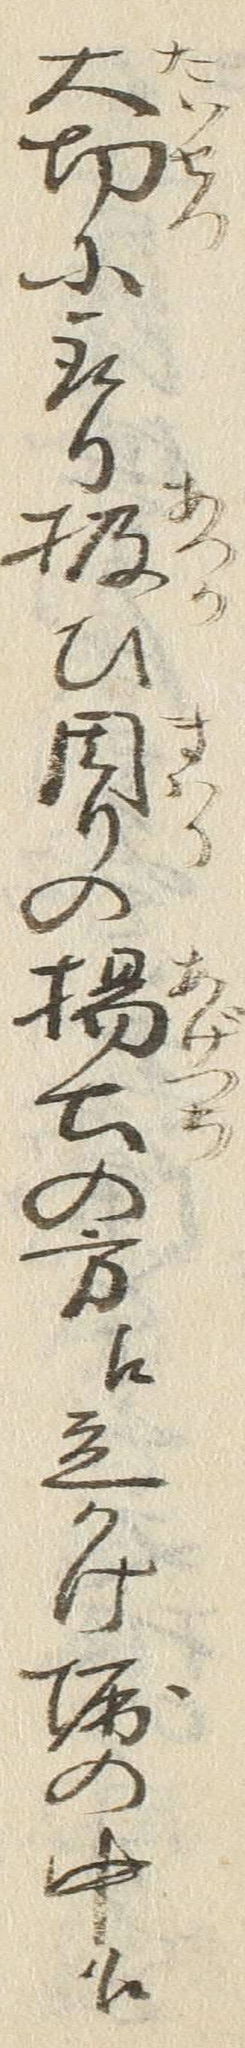大切尓取り扱ひ周りの揚土の方江立かけ堀の中江
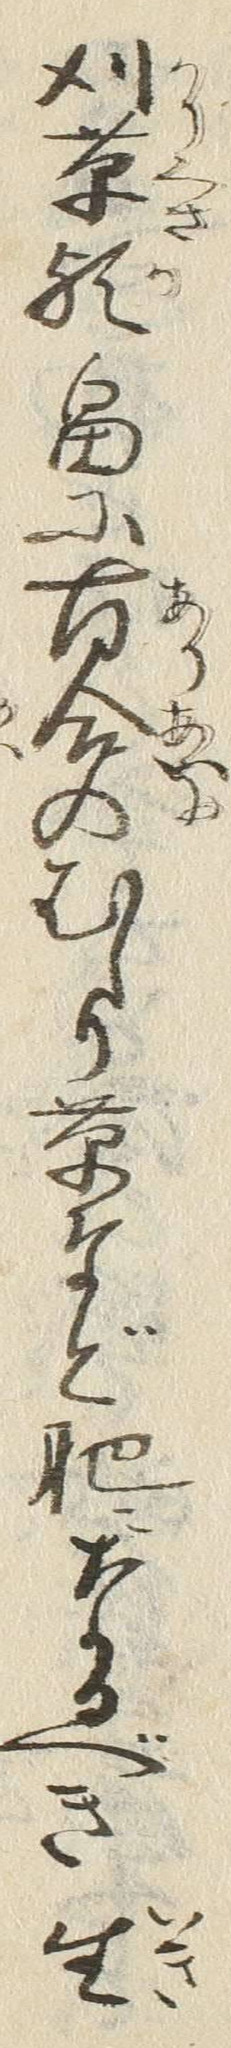刈草歟畠尓有合のむしり草など肥になるべき生
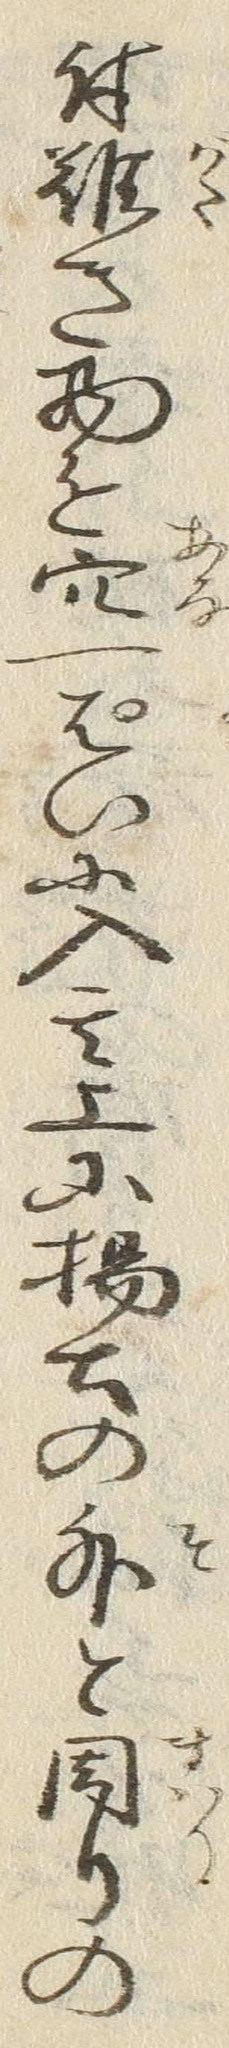付難き物を穴一ぱい尓入其上尓揚土の外と周りの
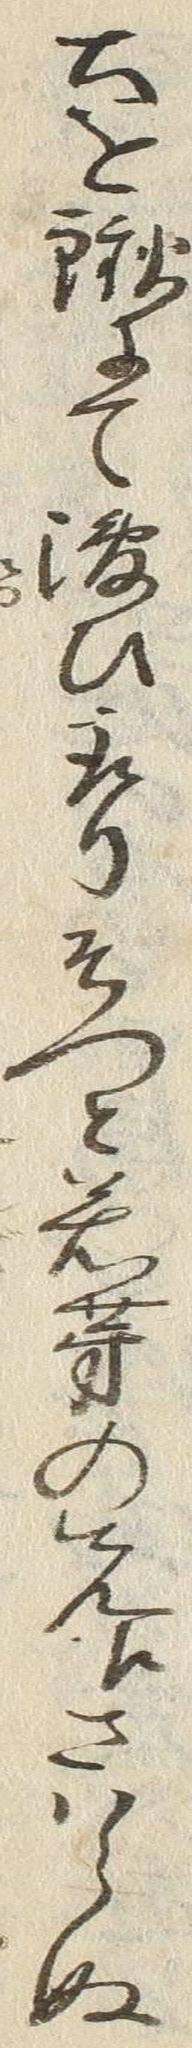土を鍬尓て浚ひ取りそつと若芽の先江さはらぬ
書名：養蠶實驗録後編
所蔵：東京大学農学生命科学図書館 国文学研究資料館
